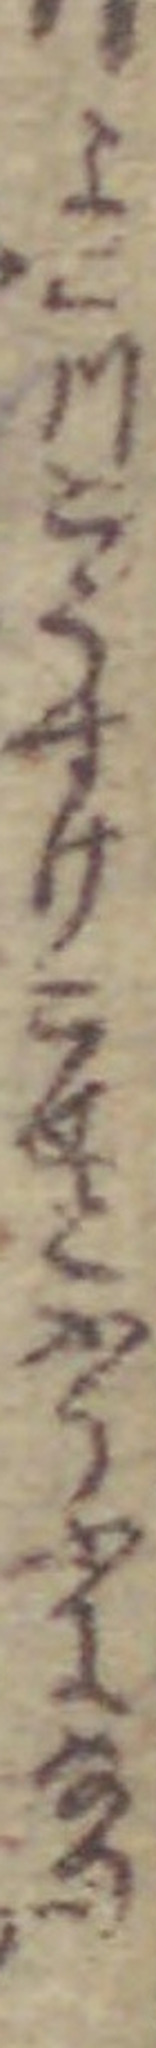よこ川こうすけこせとふうふになり
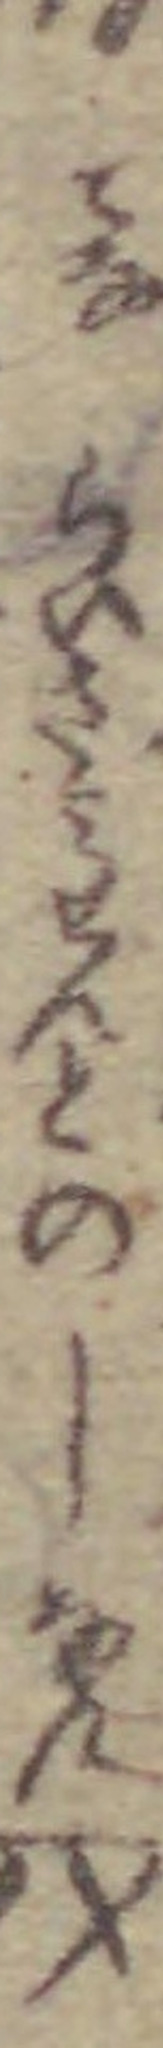てならいさみせんとのしなん
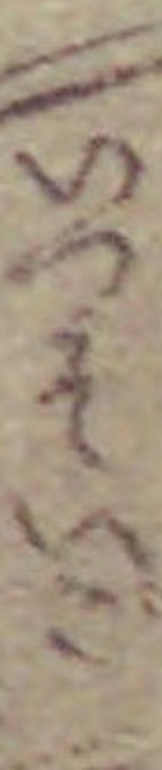いつそいご
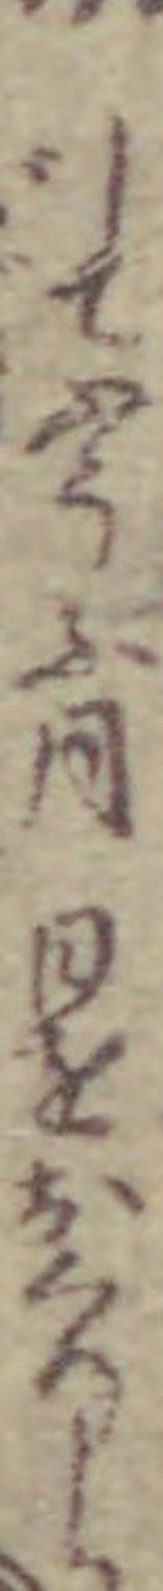してふうふ月日をおくりしか
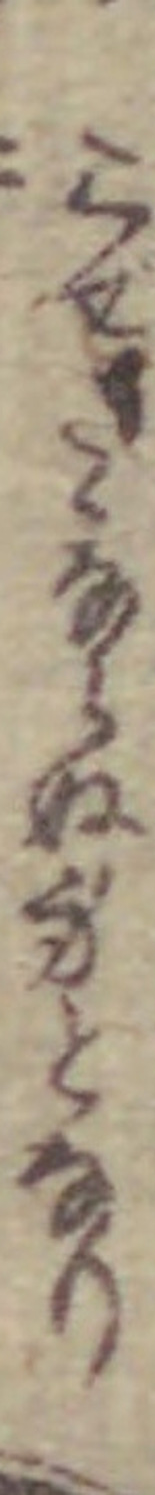ごぜたゝならぬ身となり
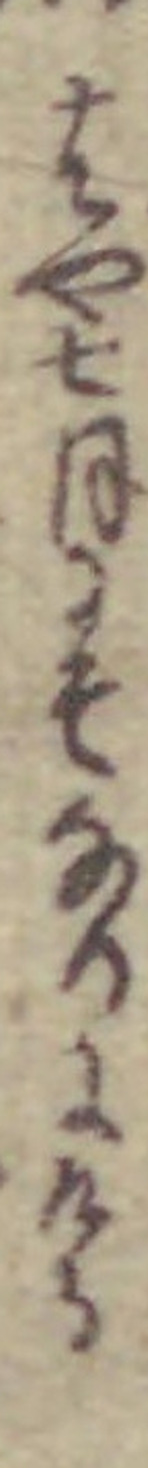はや七月にそなりにける
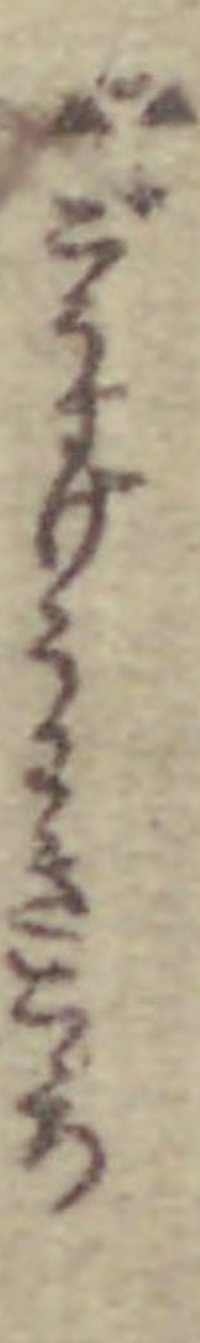ごうすけうわきこゝろ
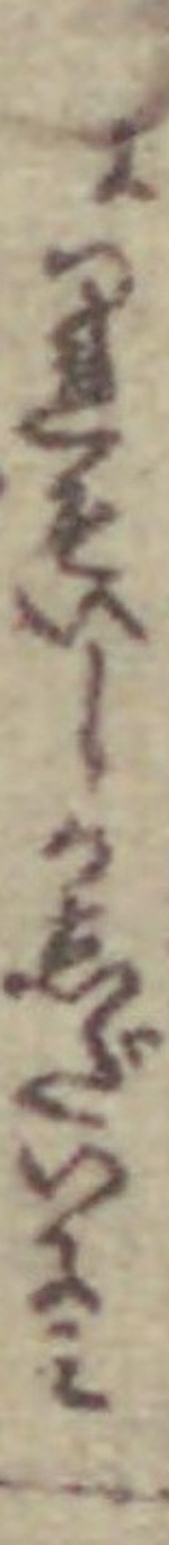つれそいしかしだいにみ
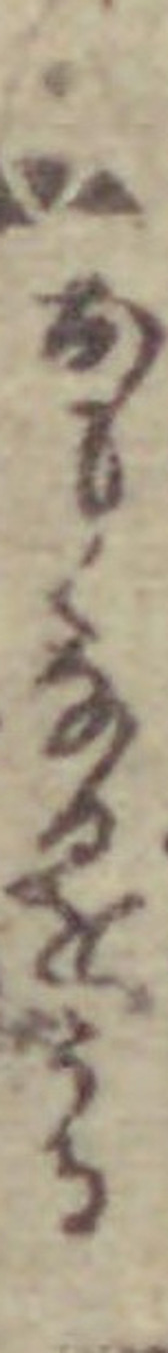おもくなるをうる
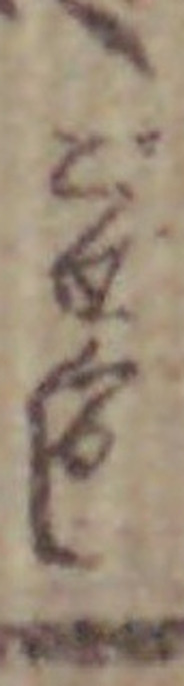ごぜくるし
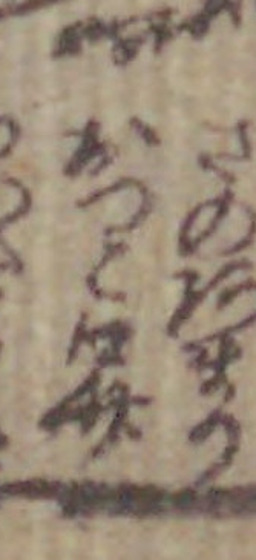おつと郷介
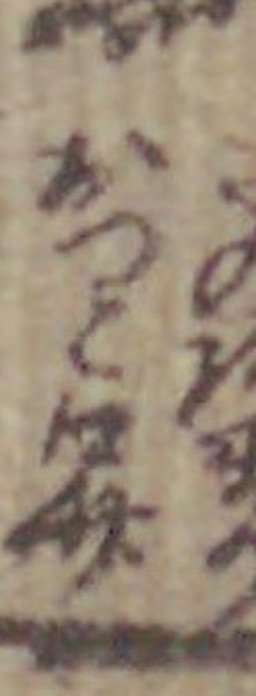おつと郷介
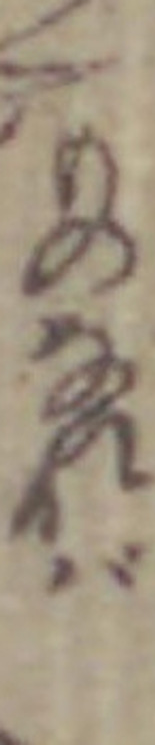ものなれば
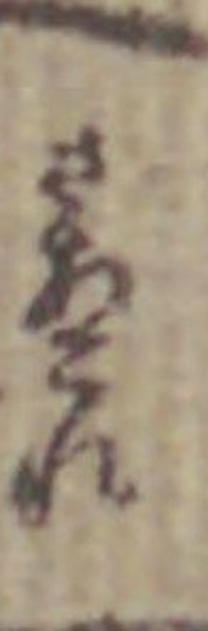さあこれ
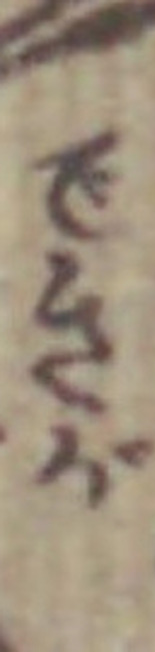できが
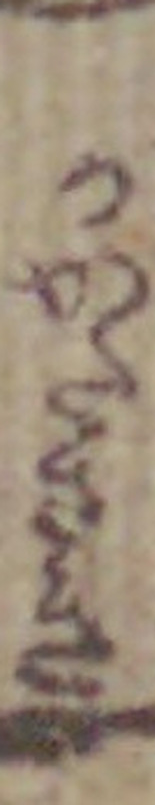かかたさき
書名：化物一家髭女 2巻
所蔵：国立国会図書館 National Diet Library, JAPAN
